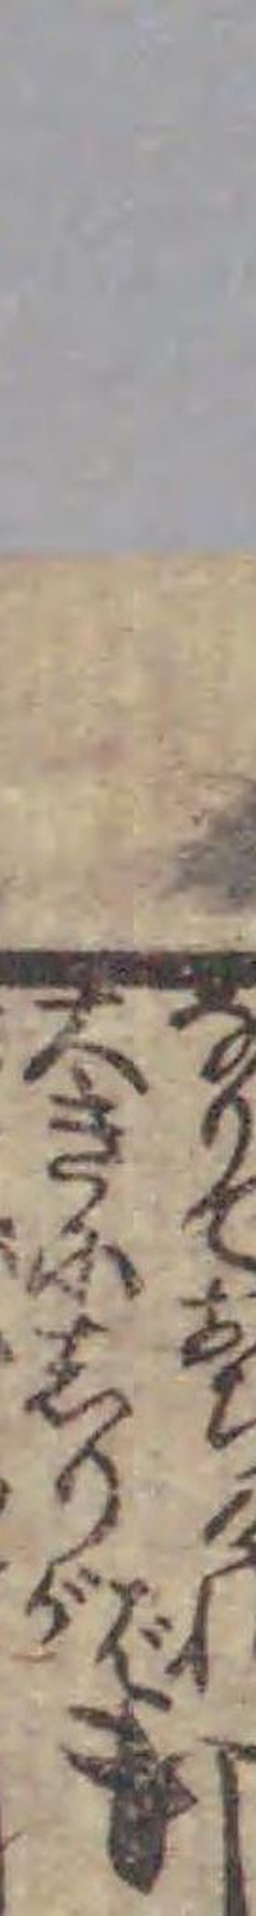大きにしりが
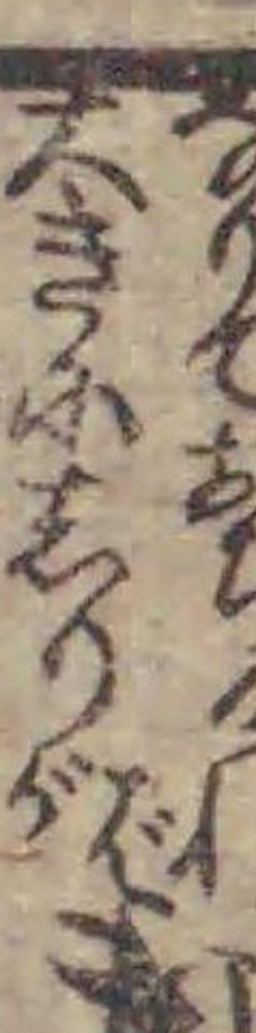大きにしりが
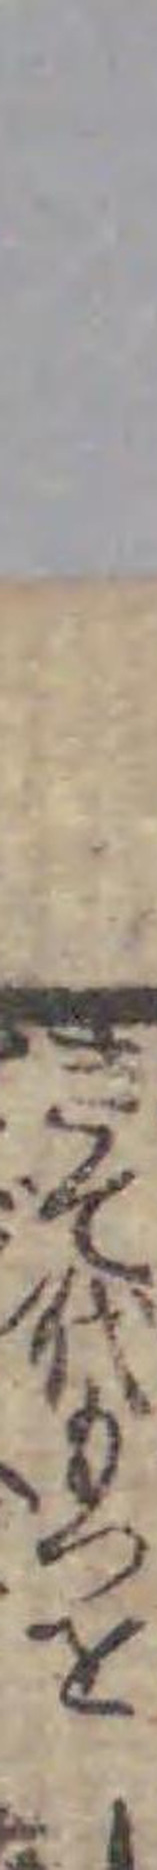きて代もつを
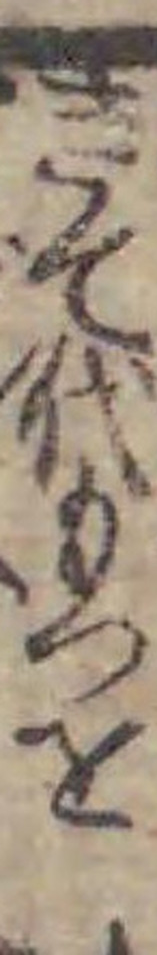きて代もつを
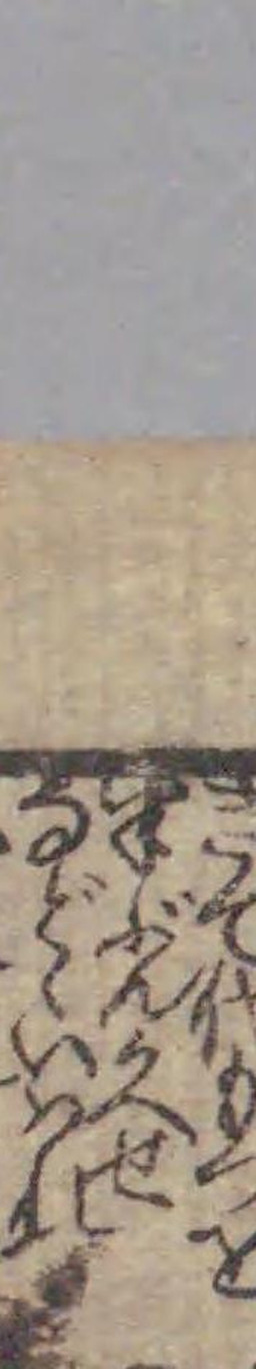などゝいはれ
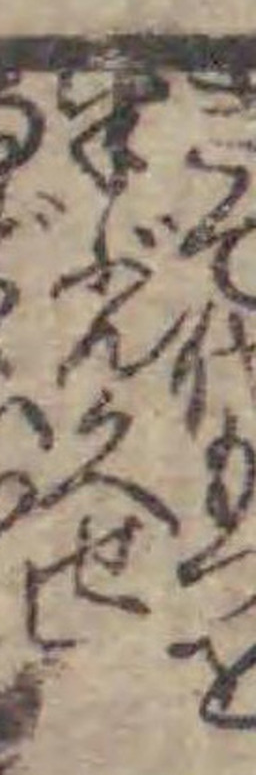半ぶんかへせ
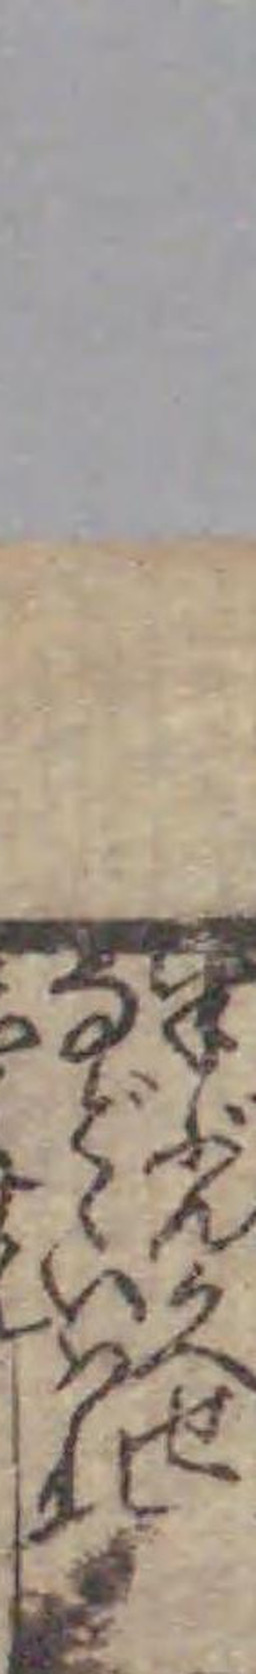などゝいはれ
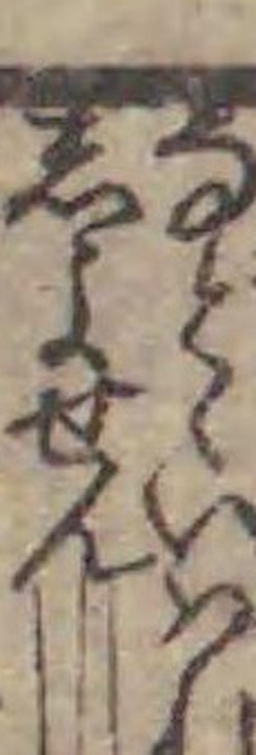しよせん
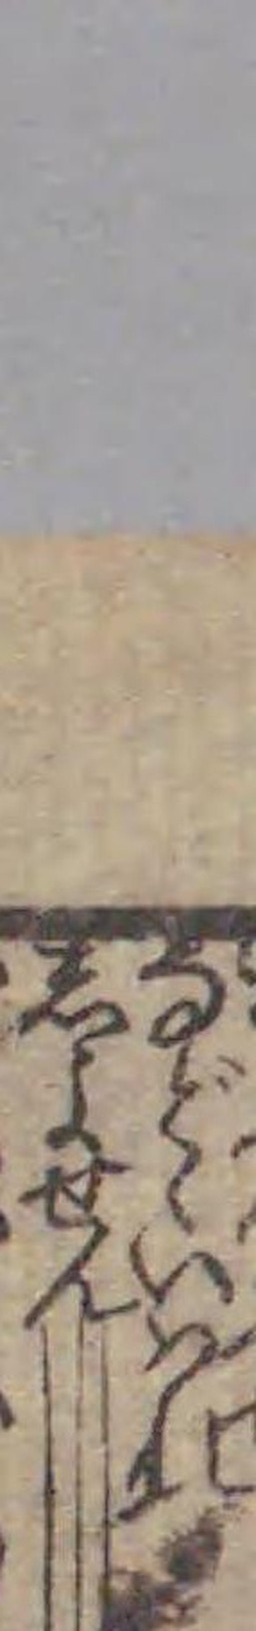しよせん
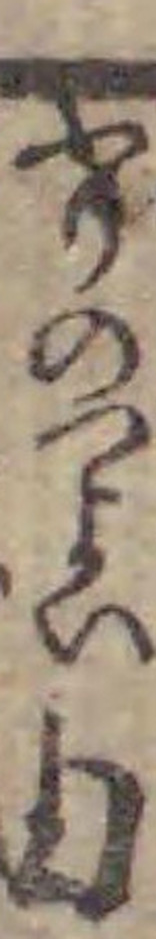ふりのつよい
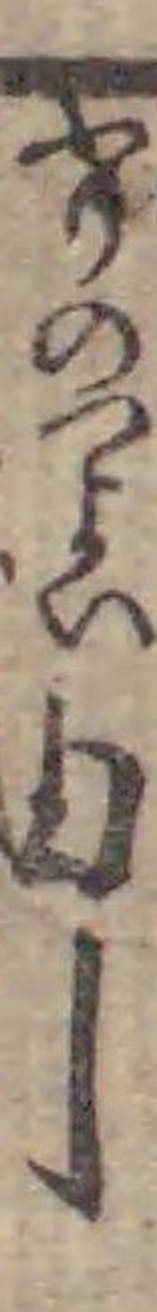ふりのつよい
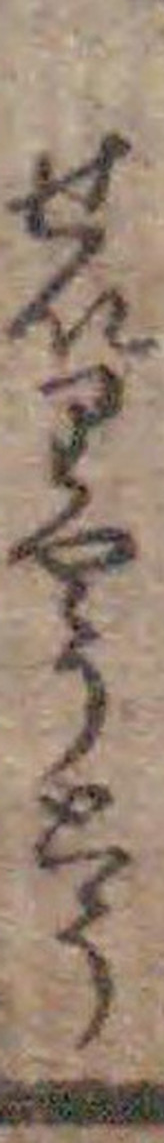せいりやうとう
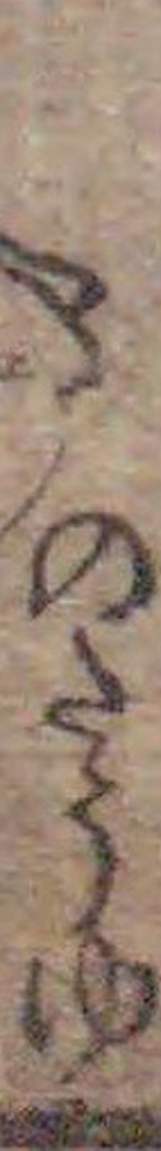のたうゆ
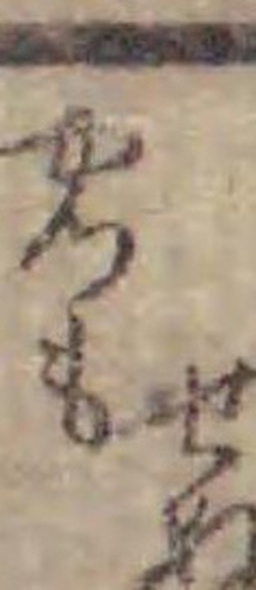やつも
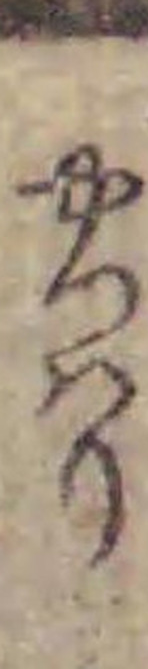やつはり
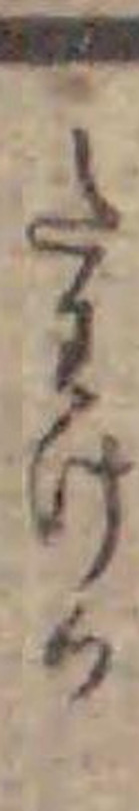たわけか
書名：本樹真猿浮気噺 : 3巻
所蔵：国立国会図書館 National Diet Library, JAPAN
